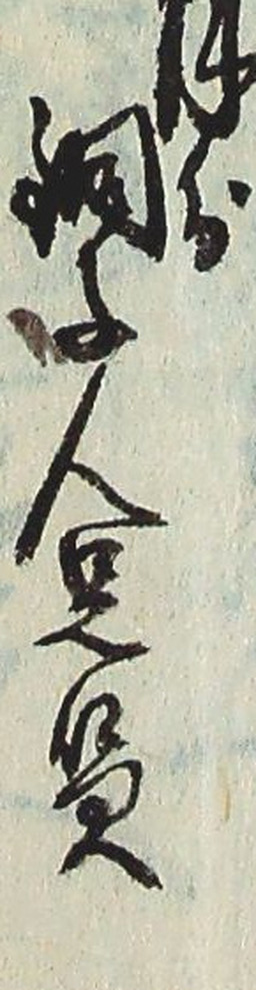銅子人足賃
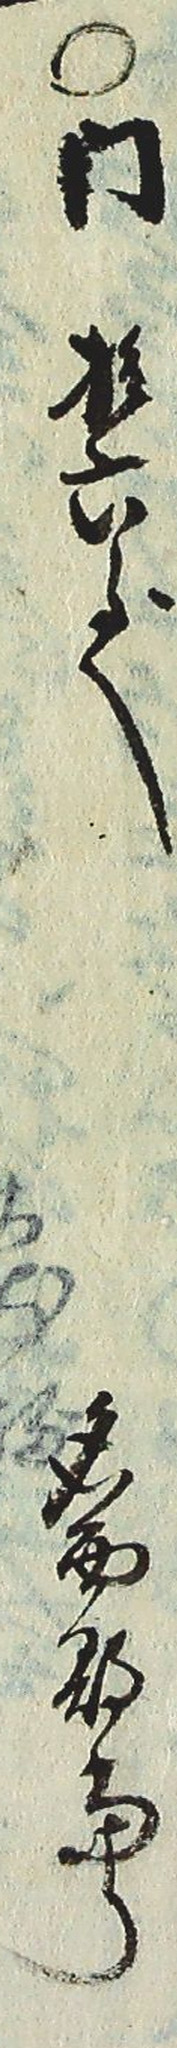内拾六匁名西郡当り
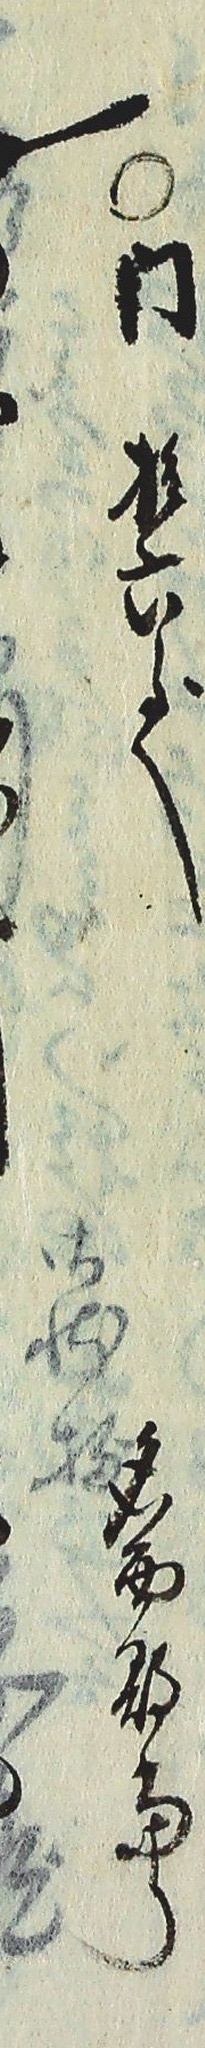内拾六匁名西郡当り
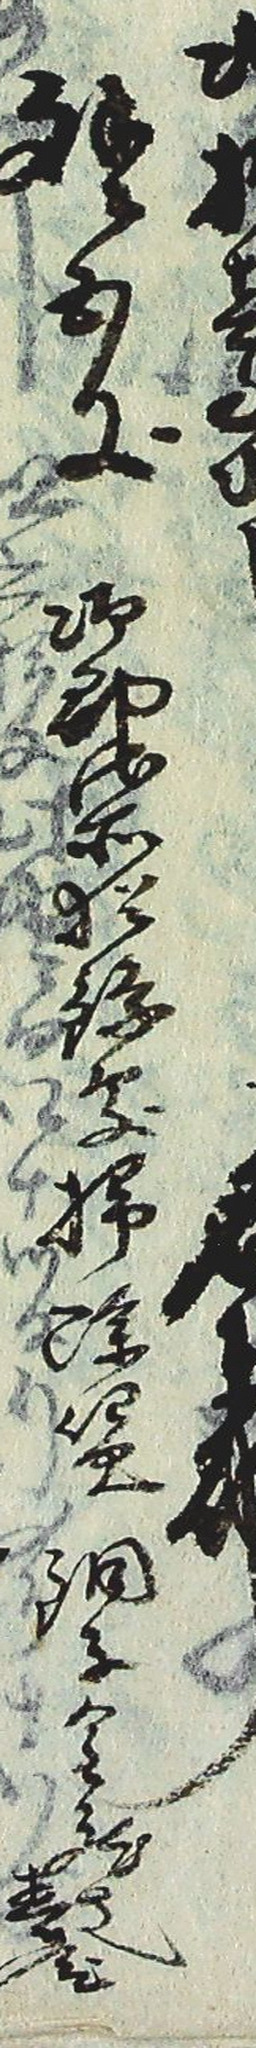外に五匁御郡代所猶予処掃除賃銅子金蔵方へ
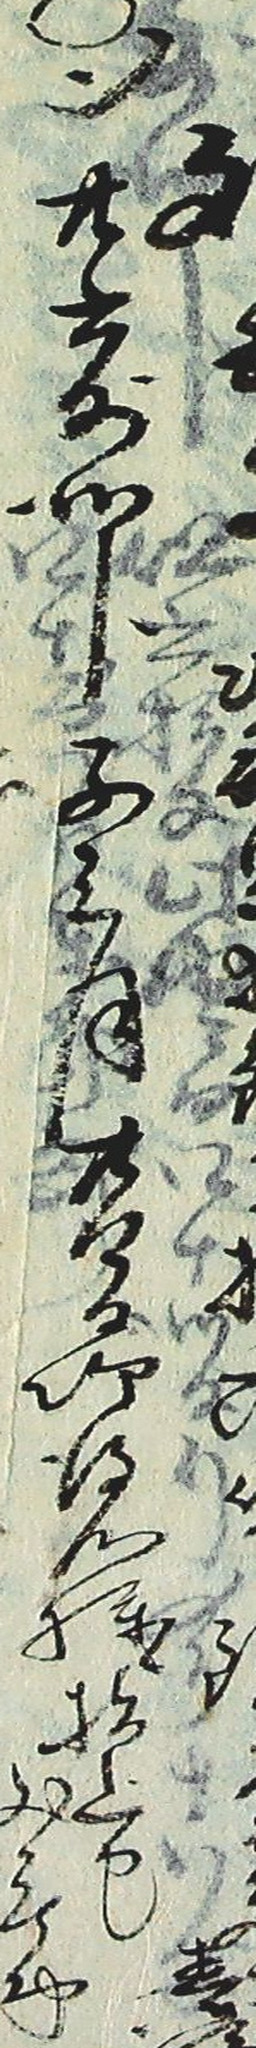〆廿六匁弐分子三月廿四日御役処様へ指上申候
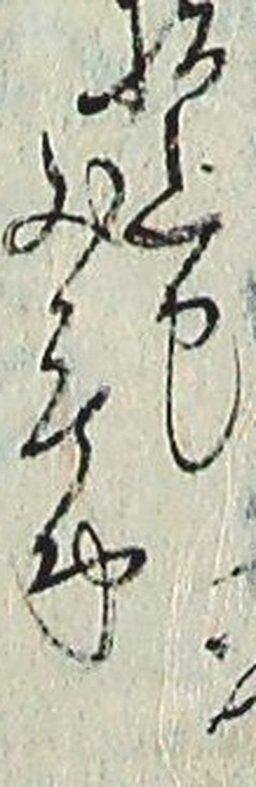使庄助
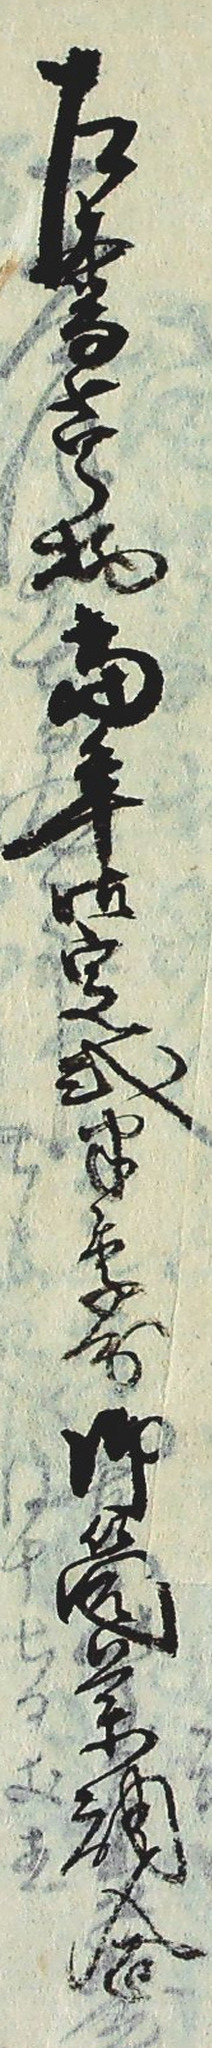左書苧柄当年御定式半季分御筒薬調合
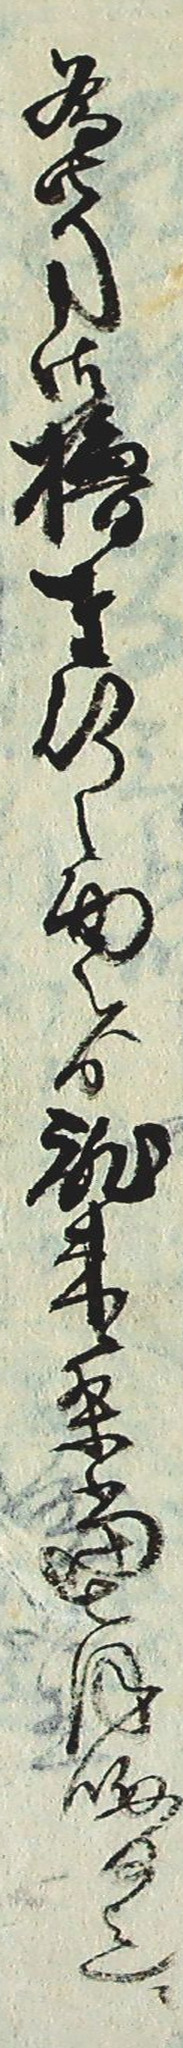為御用御櫓奉行之面々ゟ誂来候条来七月晦日迄
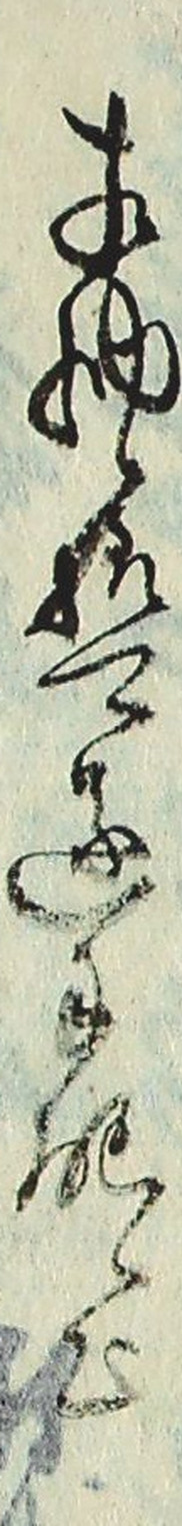相納候様可遂手配候以上
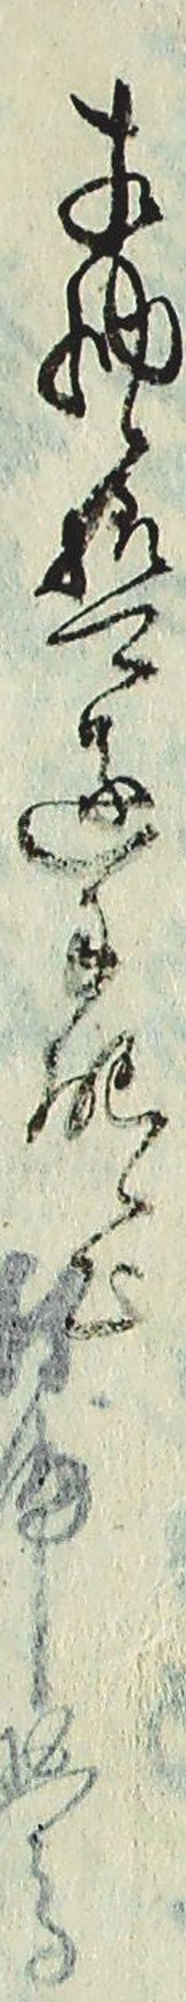相納候様可遂手配候以上
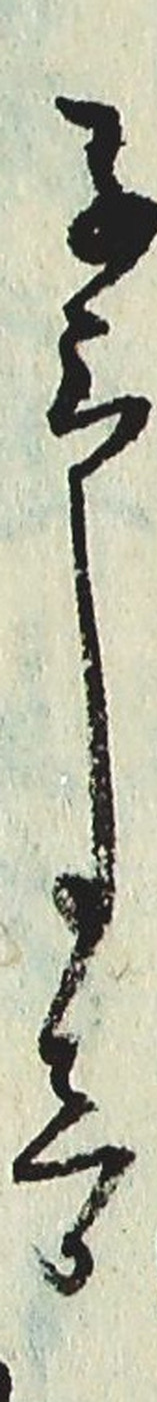子三月十二日
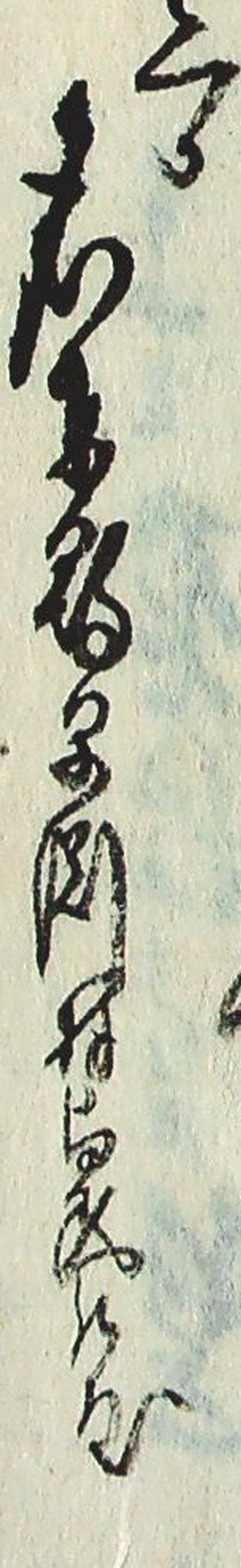名東郡早淵村与頭庄屋

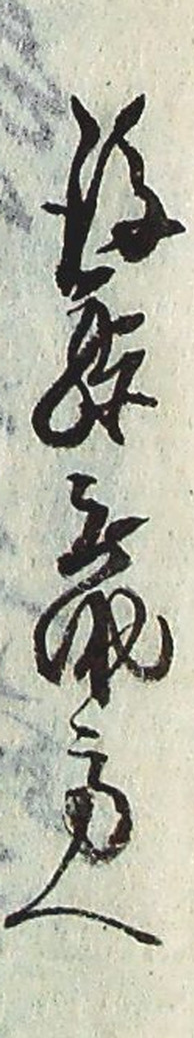後藤庄助方へ
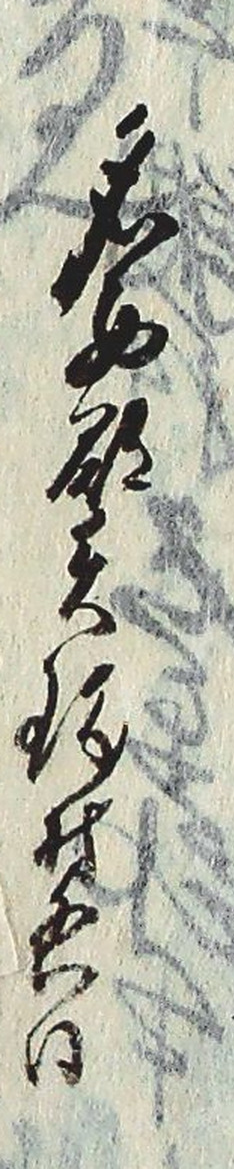名西郡矢野村右同
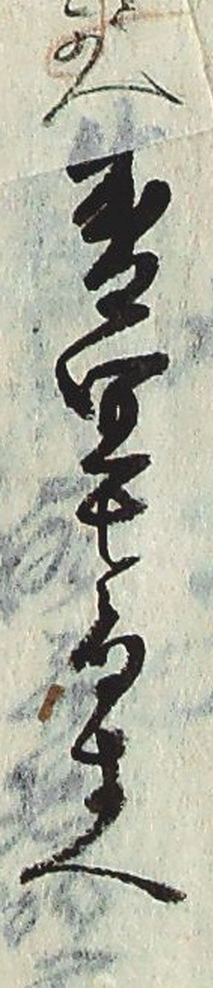盛宣七郎方へ
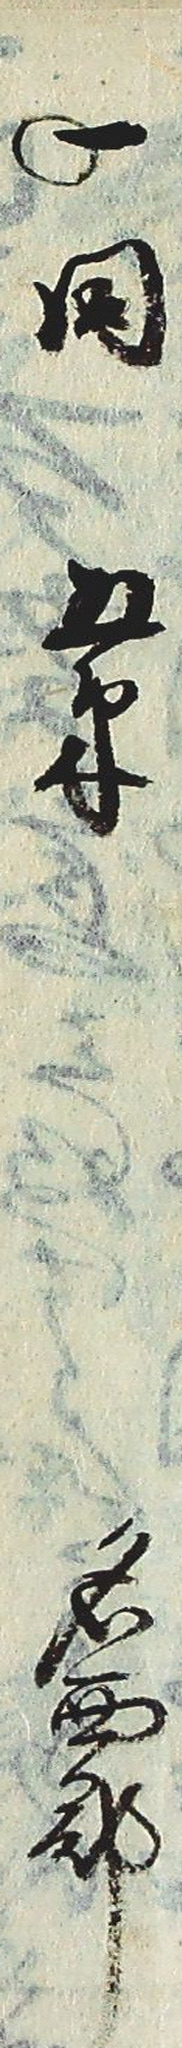一同五束名西郡
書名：名東郡中諸割賦元帳
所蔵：鳴門教育大学 Naruto University of Education
